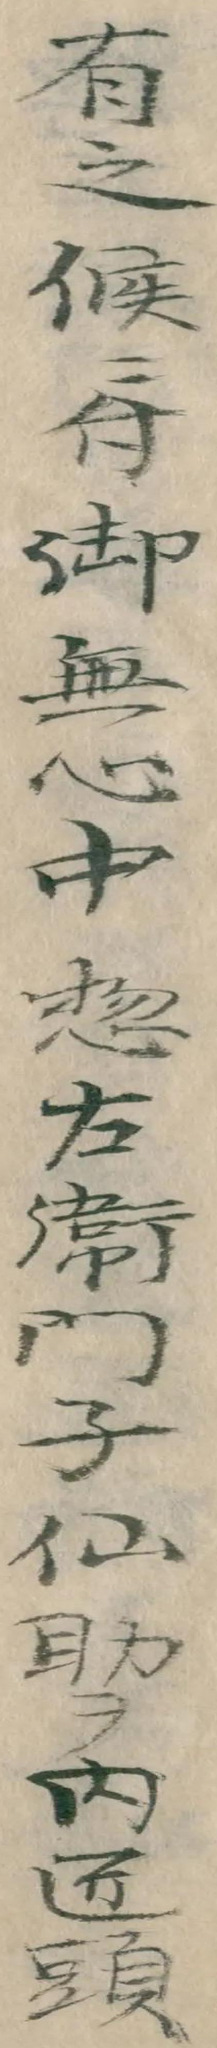有之候ニ付御無心中惣左衞門子仙助ヲ内匠頭
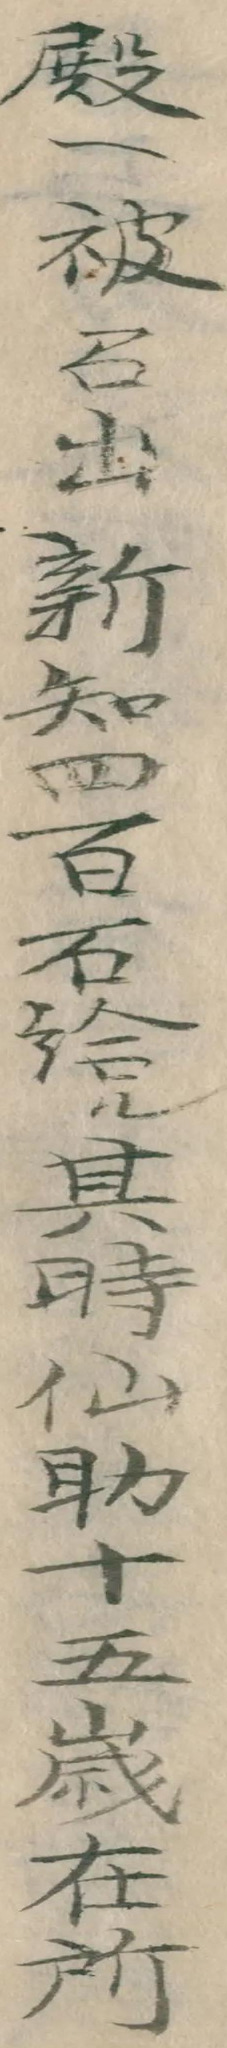殿ヘ被召出新知四百石給ル其時仙助十五歳在所
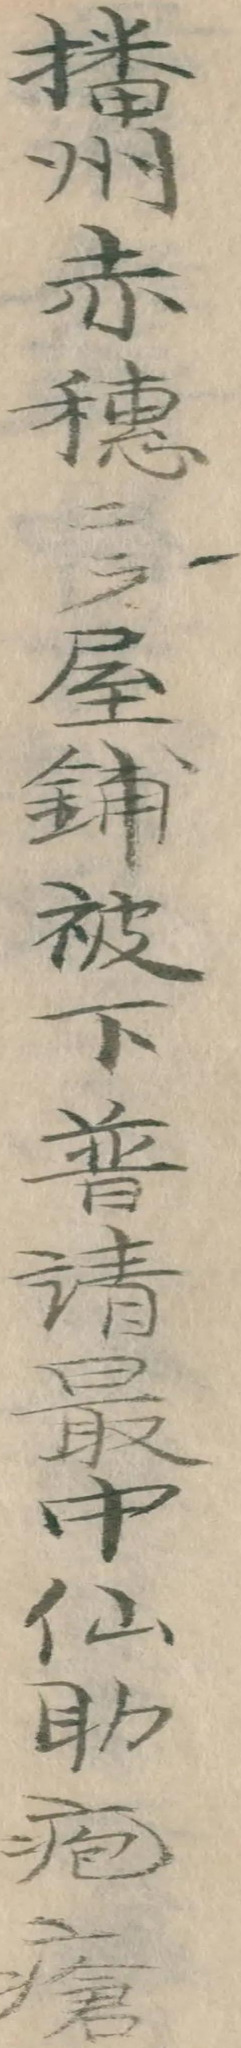播州赤穂ニテ屋鋪被下普請最中仙助疱瘡
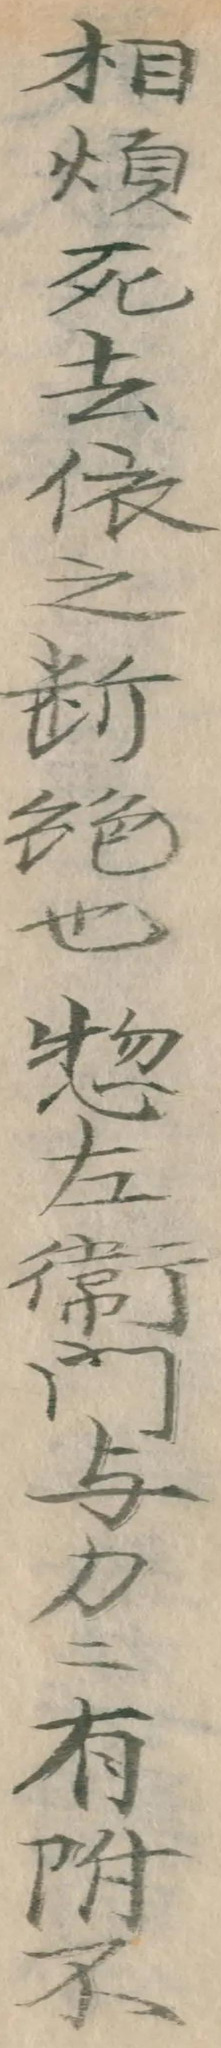相煩死去依之断絶也惣左衞門与力ニ有附不
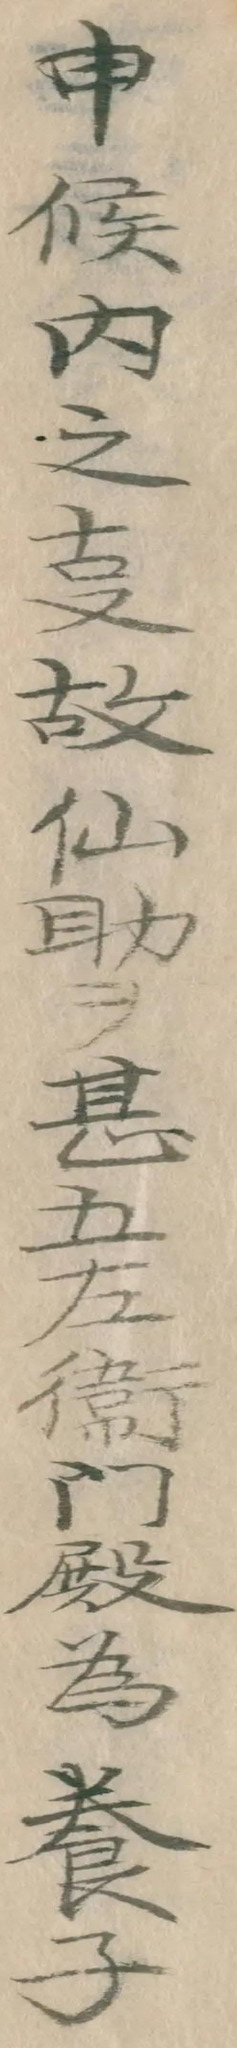申候内之事故仙助ヲ甚五左衞門殿為養子
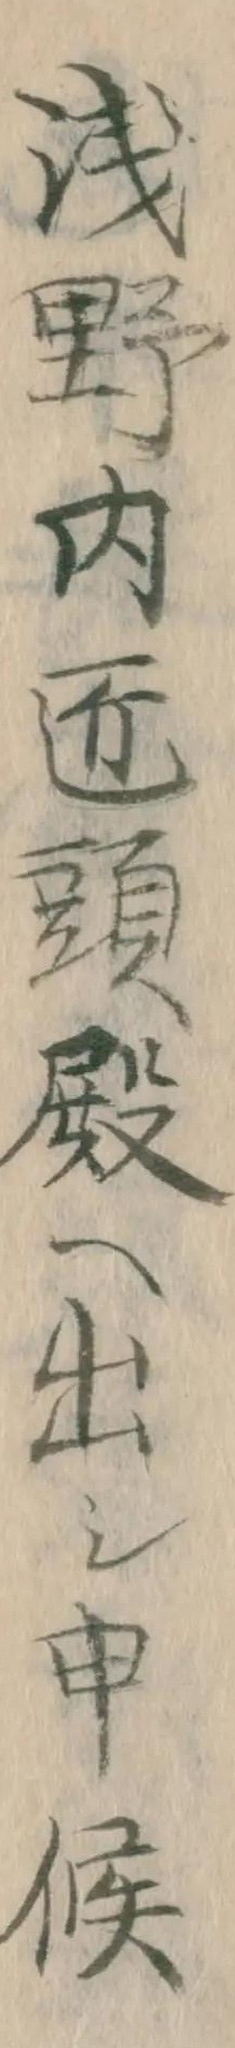浅野内匠頭殿ヘ出シ申候
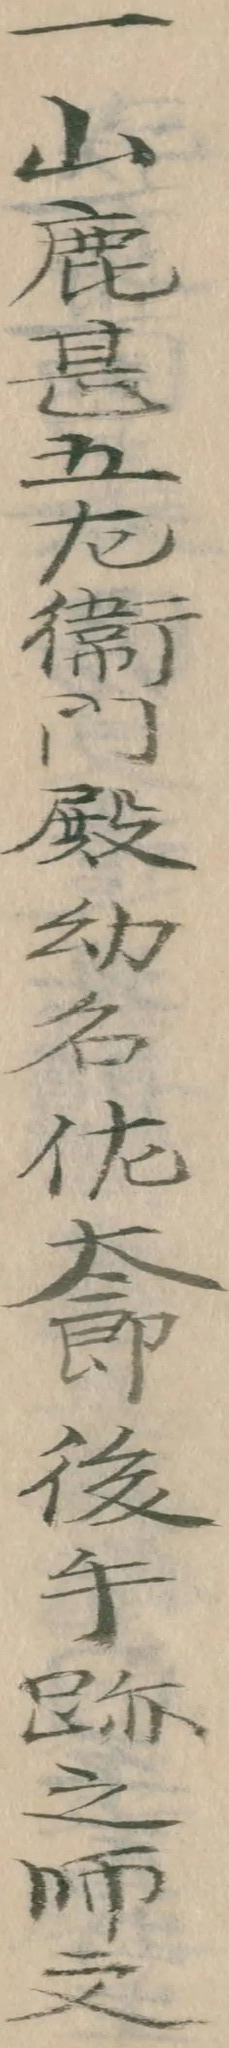一山鹿甚五左衞門殿幼名佐太郎後手跡之師文
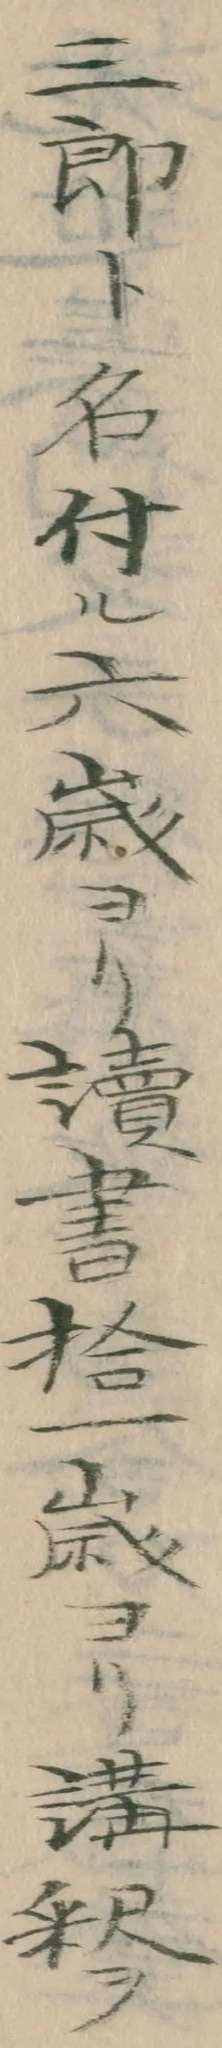三郎ト名付ル六歳ヨリ読書拾一歳ヨリ講釈ヲ
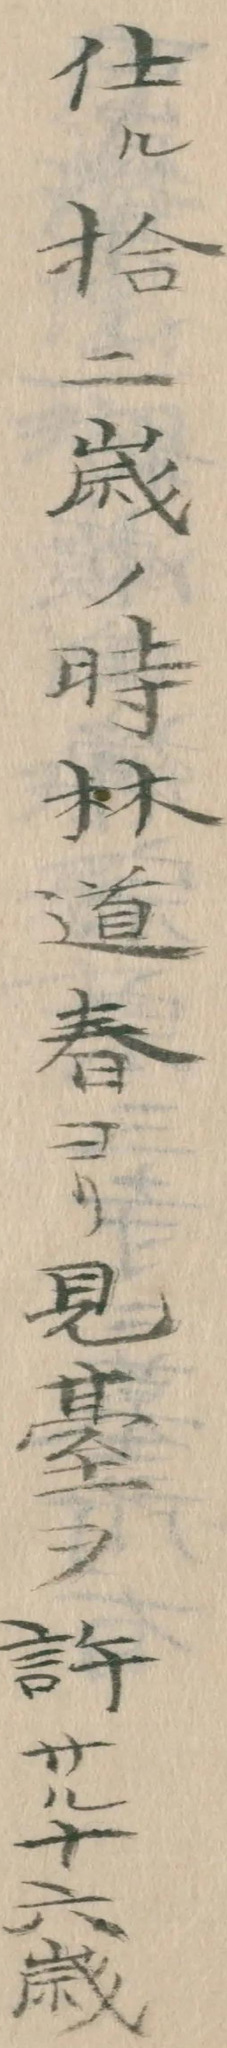仕ル拾二歳ノ時林道春ヨリ見台ヲ許サル十六歳
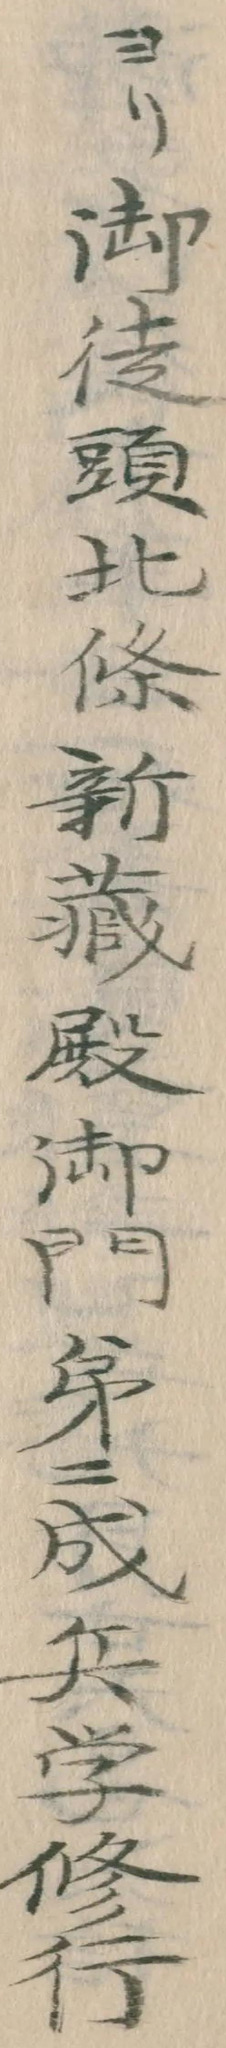ヨリ御徒頭北条新蔵殿御門弟ニ成兵学修行
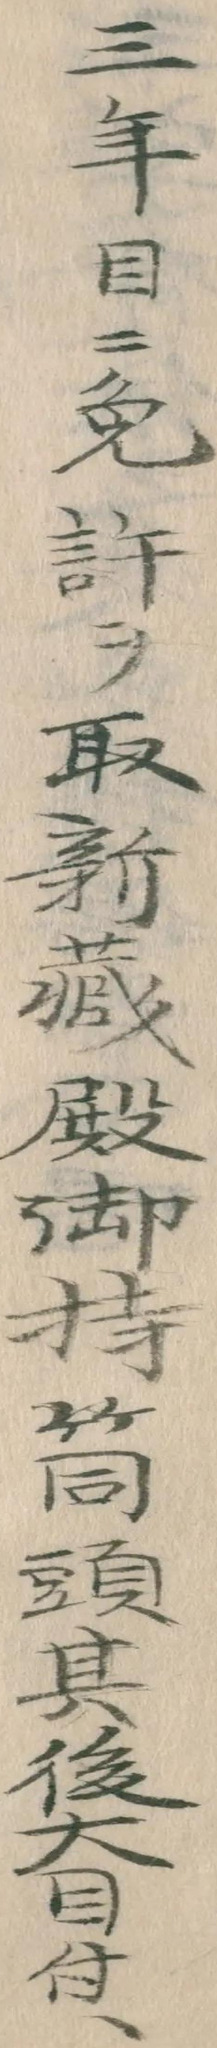三年目ニ免許ヲ取新蔵殿御持筒頭其後大目付
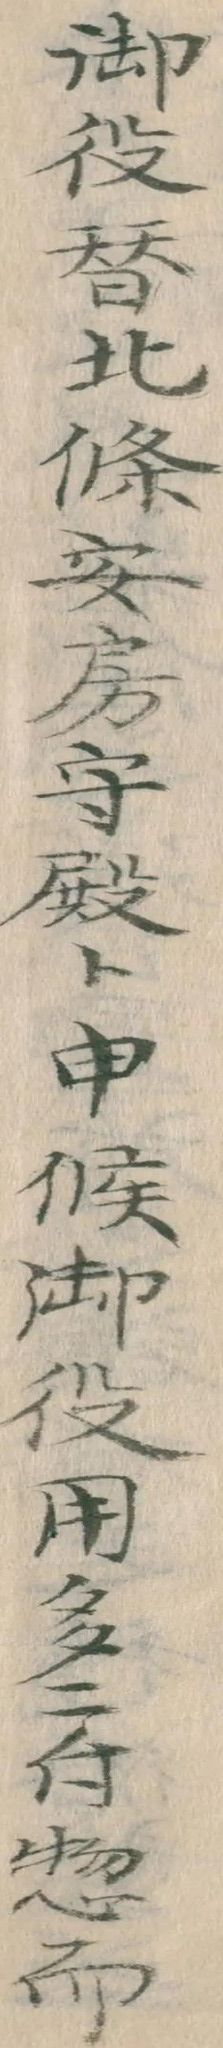御役北条安房守殿ト申候御役用多ニ付惣テ
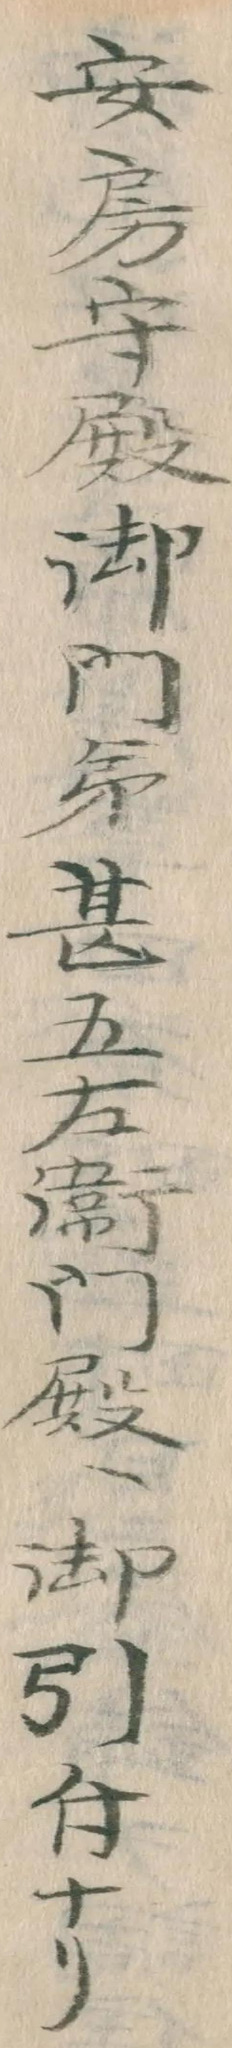安房守殿御門弟甚五左衞門殿ヘ御引付ナリ
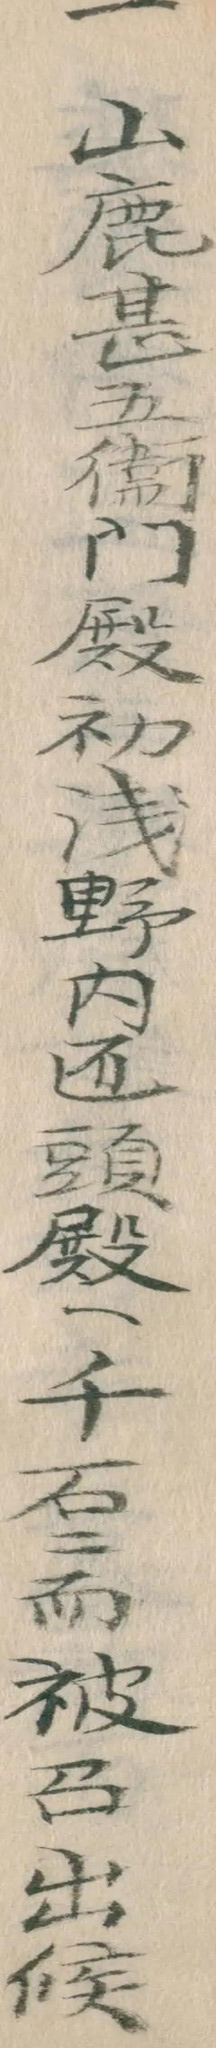一山鹿甚五左衞門殿初浅野内匠頭殿ヘ千石ニテ被召出候
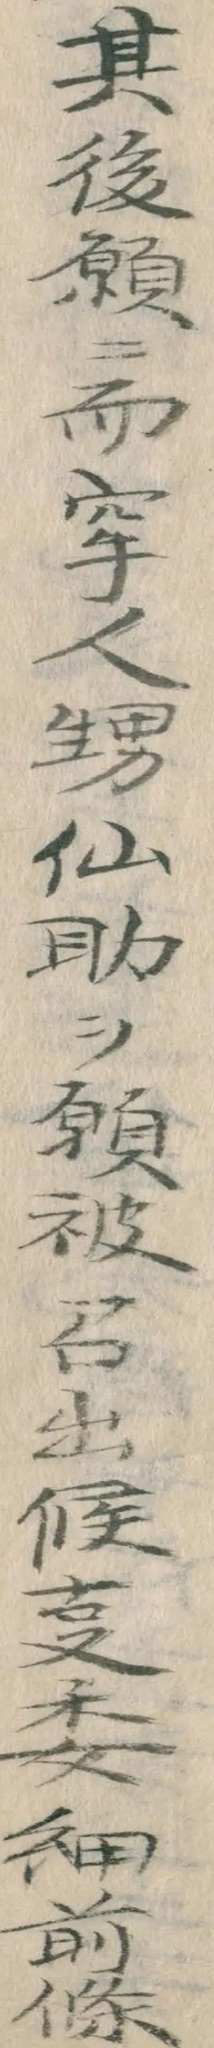其後願ニテ牢人甥仙助ヲ願被召出候事委細前条
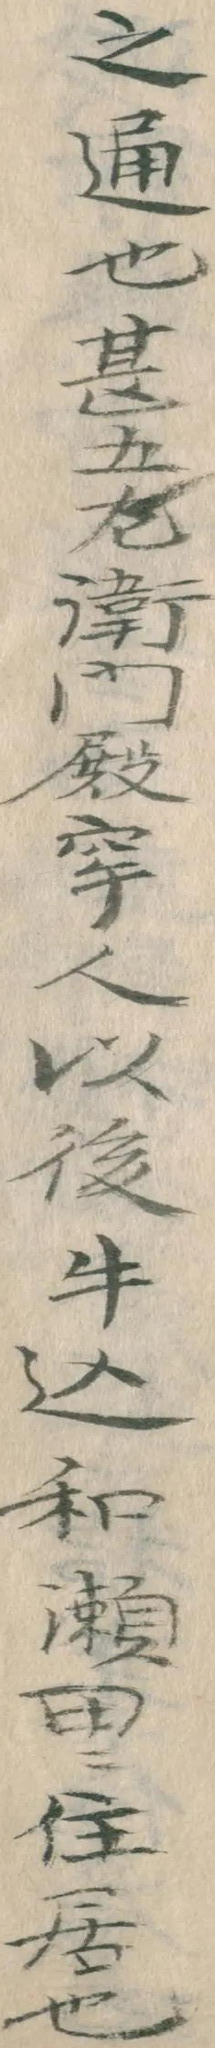之通也甚五左衛門殿牢人以後牛込和瀬田ニ住居也
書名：輪池叢書. 12
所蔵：国立国会図書館 National Diet Library, JAPAN
